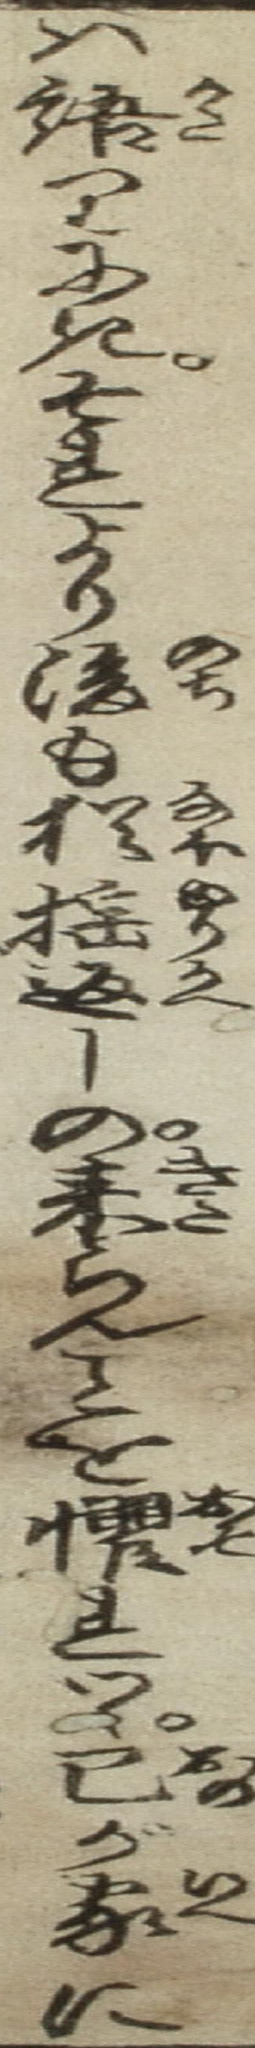は語りにき。それより後も猶揺返しの。来らんことを懼れツヽ。己が家に
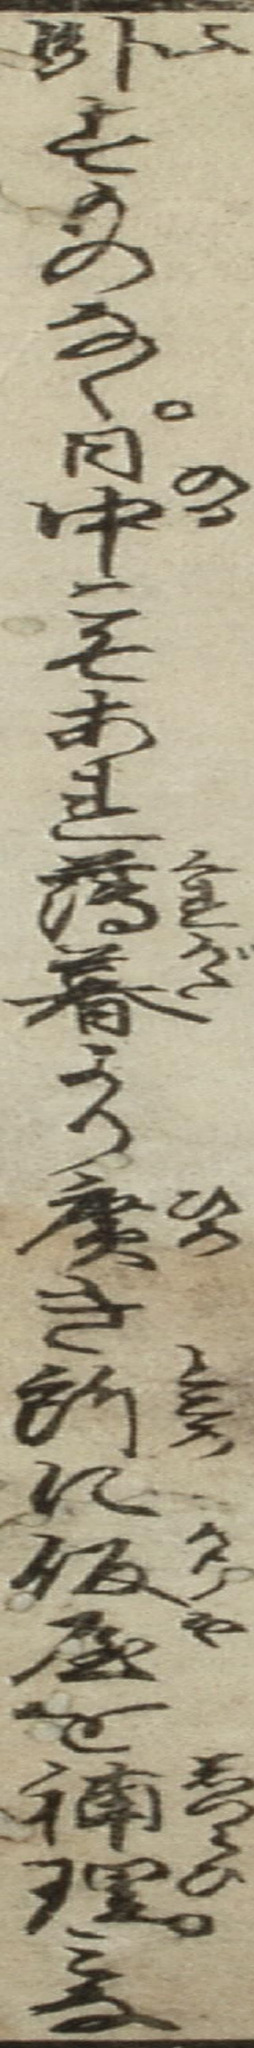臥すものなく。日中こそあれ薄暮より広き所に仮屋を補理。みな
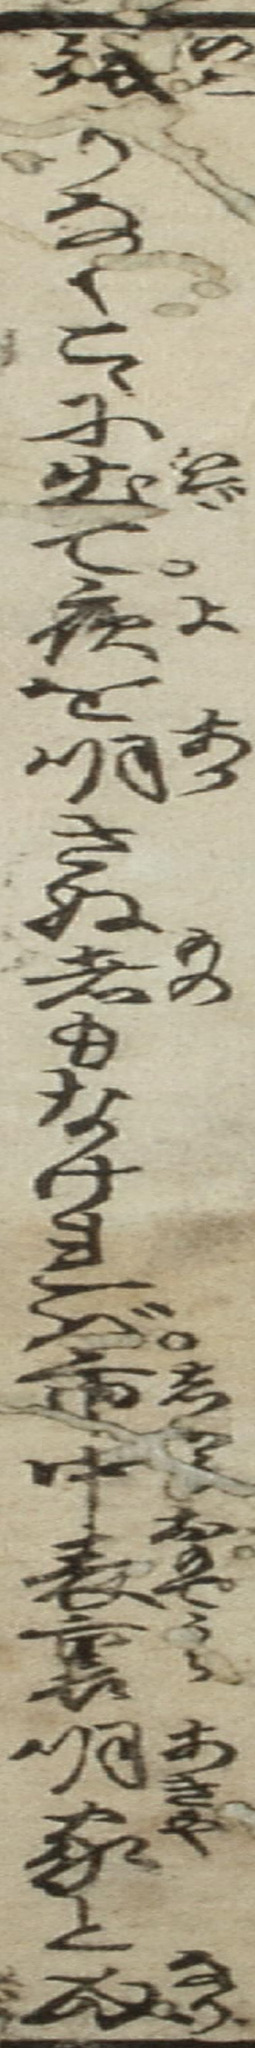残りなくこゝに出て。夜も明さぬ者もなければ。市中表裏明家と成
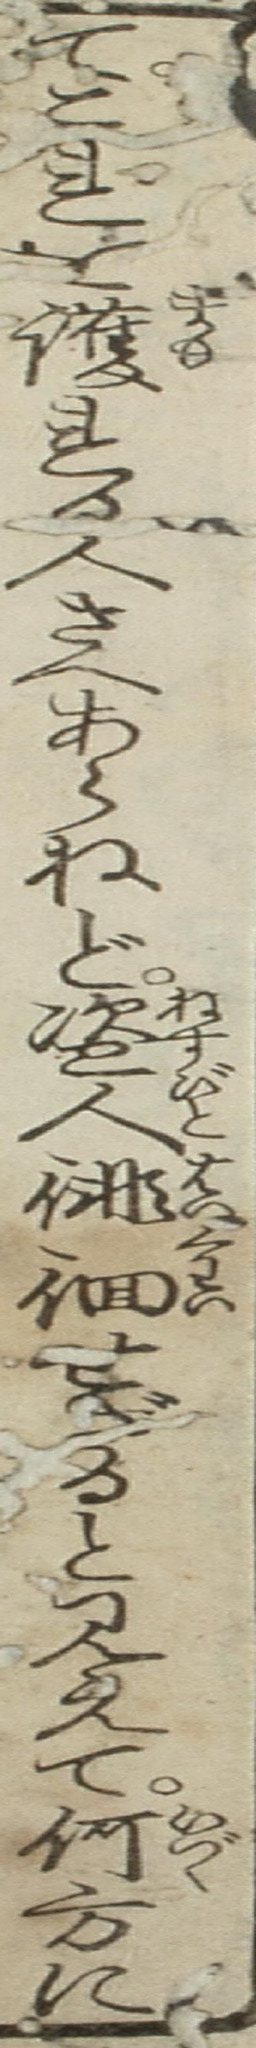て。これを護れる人さへあらねど。盗人徘徊せざると見えて。何方に
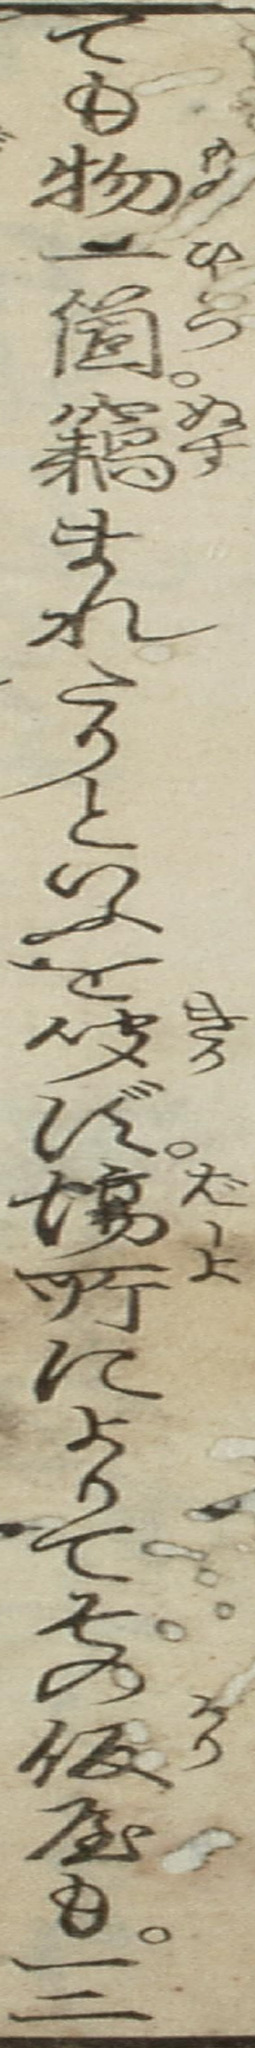ても物一箇。竊まれたりといふを聞ず。場所によりてその仮屋も。一二
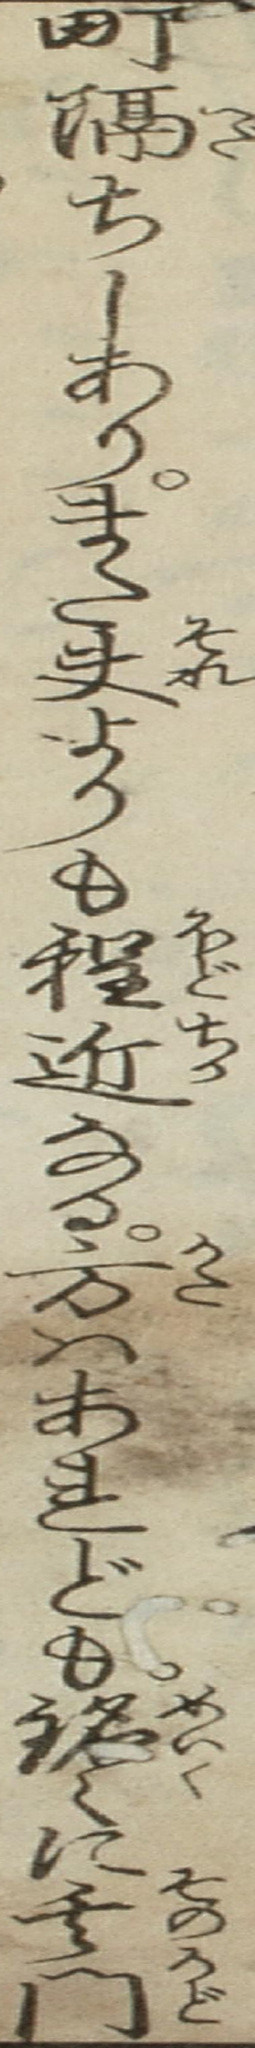町隔ちしあり。また夫よりも程近なる。方はあれども。銘〻に其門
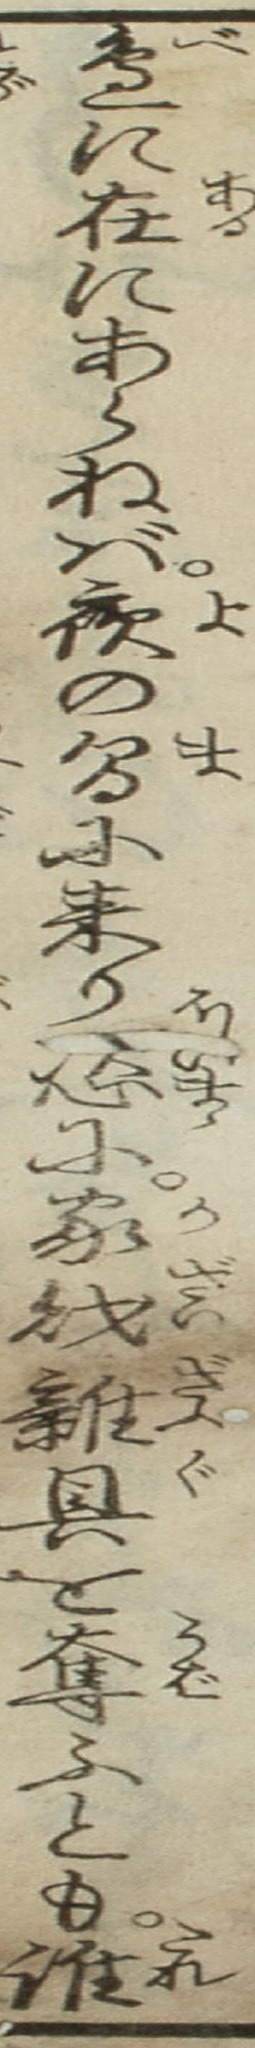辺に在にあらねば。夜の間に来り恣に。家財雑具を奪ふとも。誰
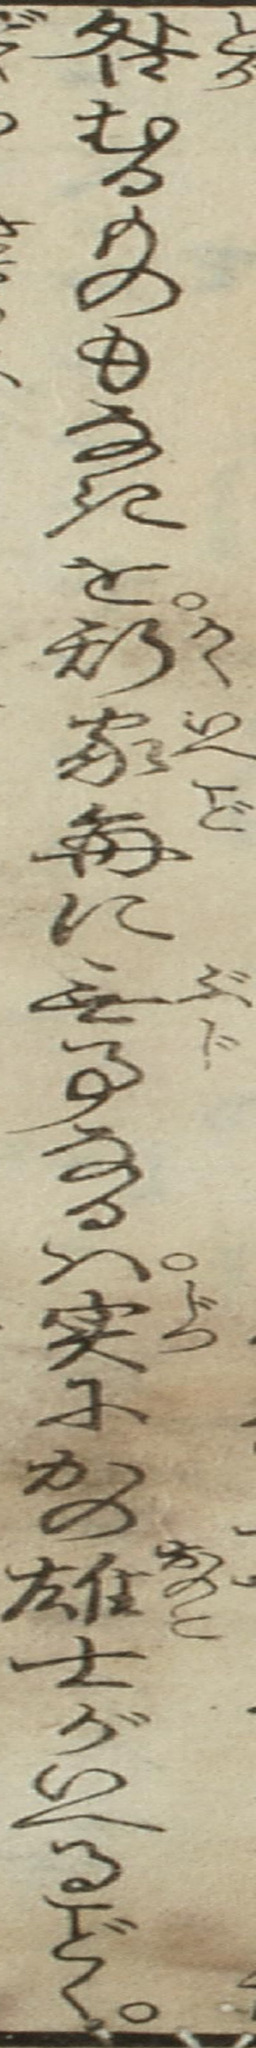咎むるものもなきを。斯家毎に無事なるは。実にかの雄士がいへるごとく。
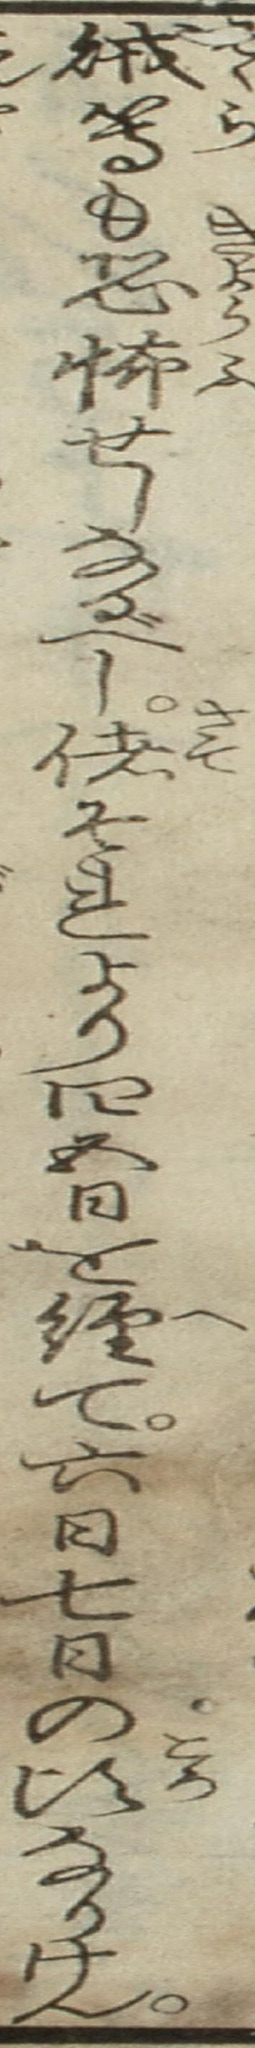賊等も恐怖せしなるべし。偖それより四五日を経て。六日七日の頃なりけん。
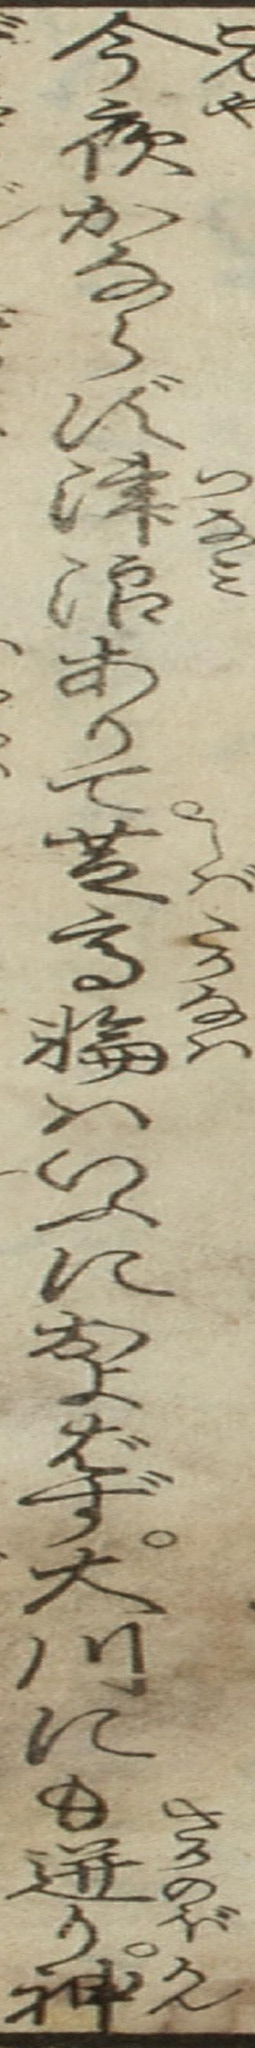今夜かならず津浪ありて。芝高輪はいふにおよばず。大川にも迸り。神
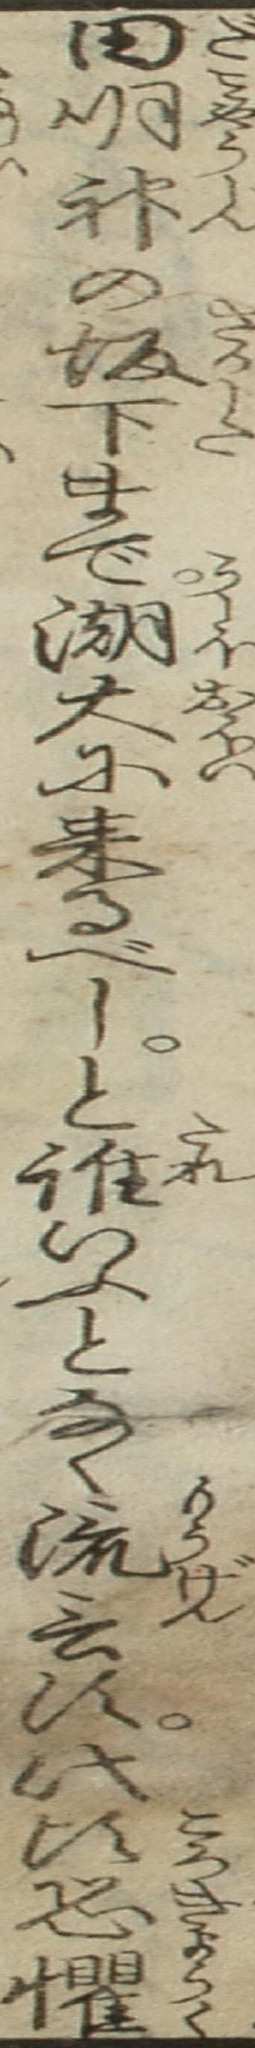田明神の坂下まで。潮大に来るべし。と誰いふとなく流言す。此頃恐懼
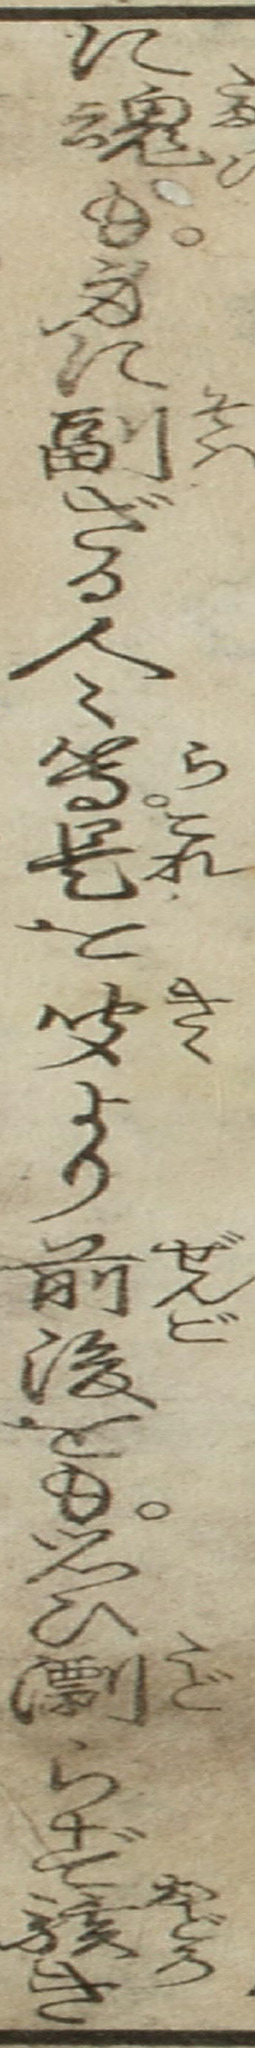に魂も。身に副ざる人〻等。是を聞より前後をも。思ひ漂らず駭き
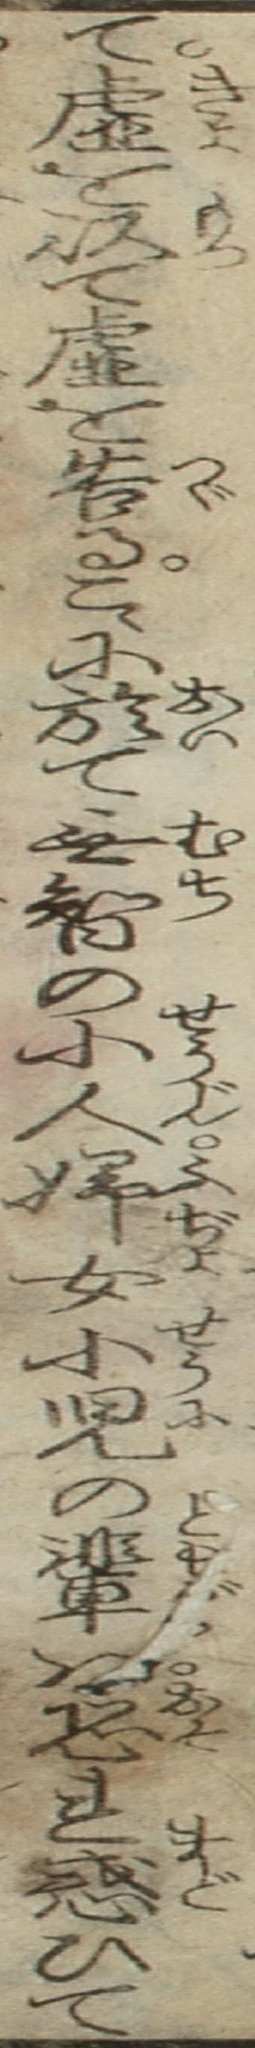て。虚を以て虚を告る。こゝに於て無智の小人。婦女小児の輩は。恐れ惑ひて
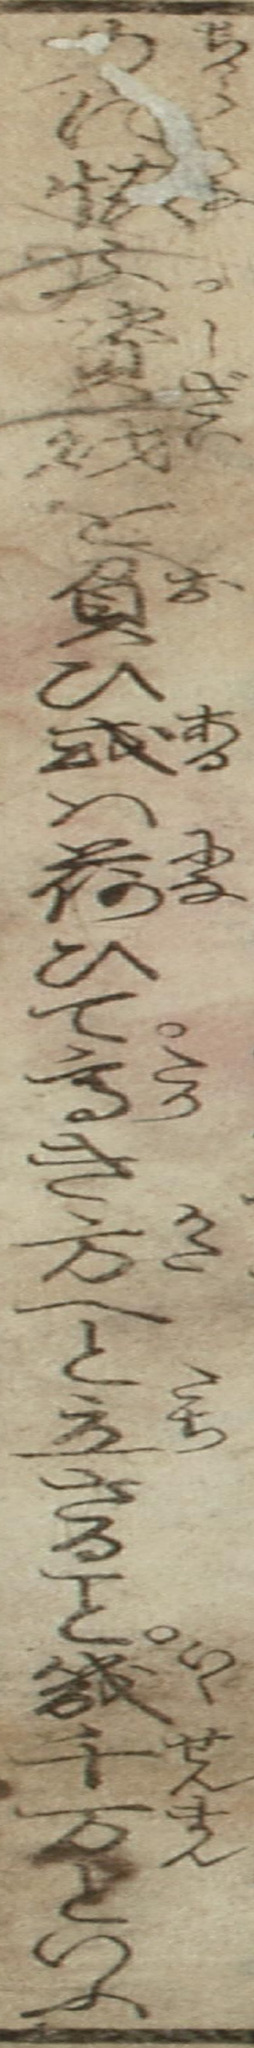力に協ふ。資財を負ひ或は荷ひて。高き方へと立さること。幾千万といふ

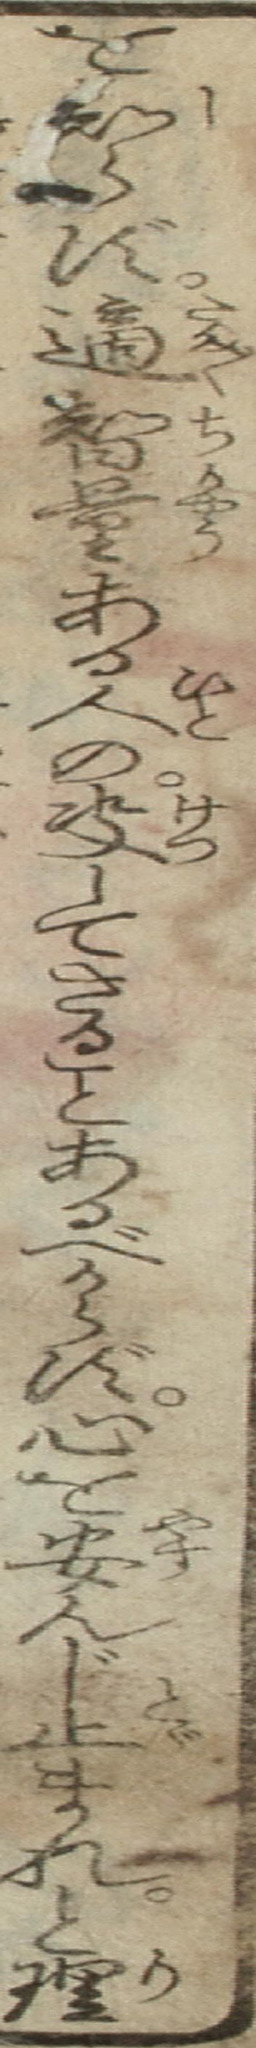を知らず。適智量ある人の。決してさることあるべからず。心を安んじ止まれ。と理
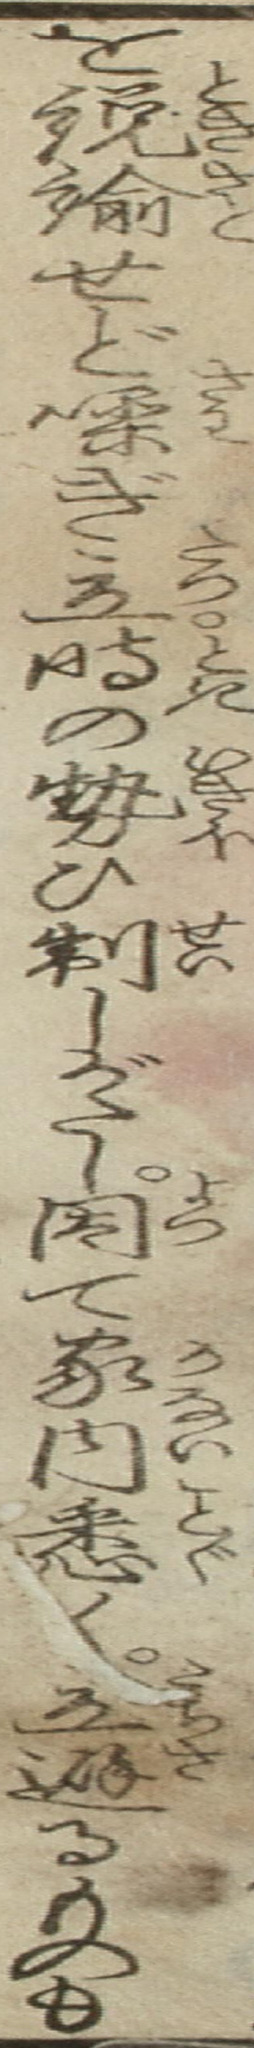を説諭せど噪ぎ立。時の勢ひ制しがたし。因て家内悉く。立避るものも
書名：安政見聞録　中
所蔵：東京大学地震研究所図書室 Earthquake Research Institute Library, The University of Tokyo, JAPAN
